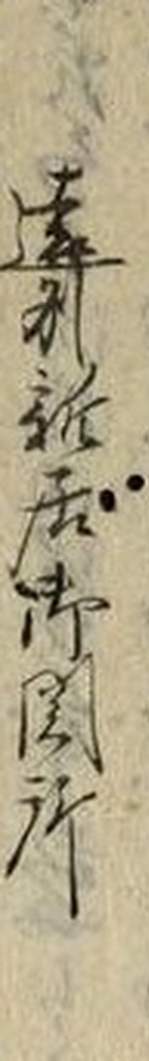遠州新居御関所
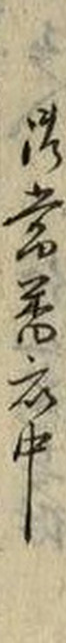御当番衆中
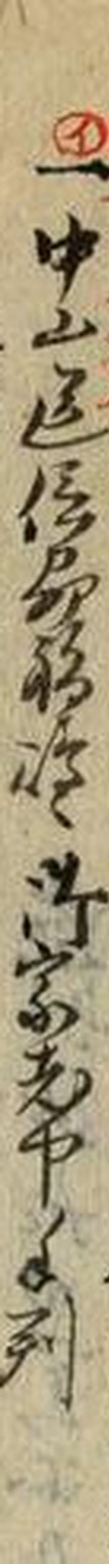一中山道信州福嶋へ御家老中手判
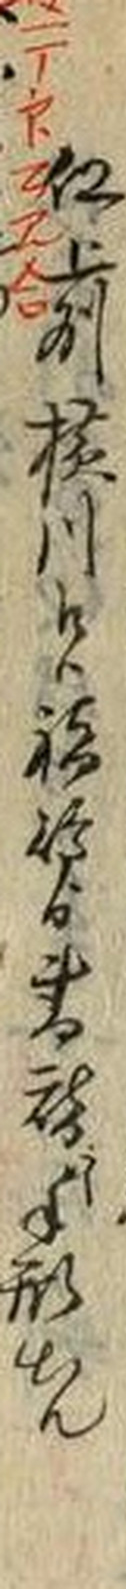但上州横川江ハ福嶋ゟ書替之手形出ル
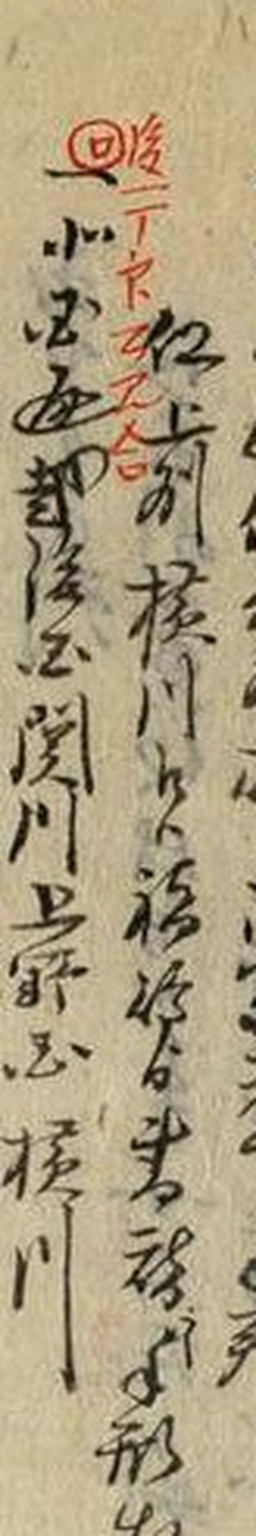一北国通越後国関川上野国横川
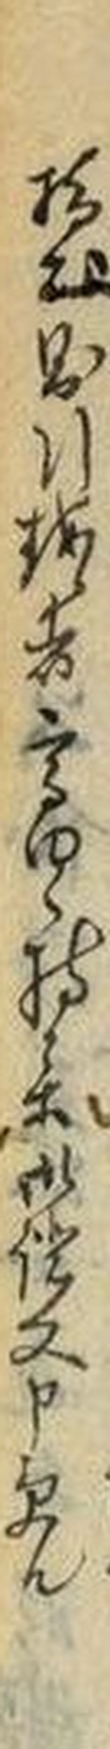指出則引越候者高田へ持参御証文申受ル
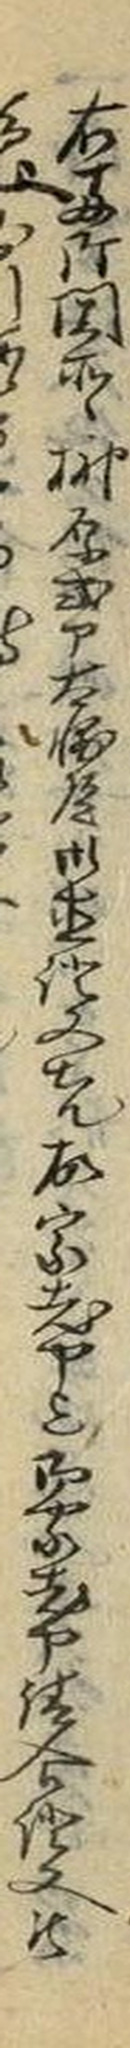右両御関所へ榊原式部大輔殿御直証文出ル故家老中迄御家老中請合証文被
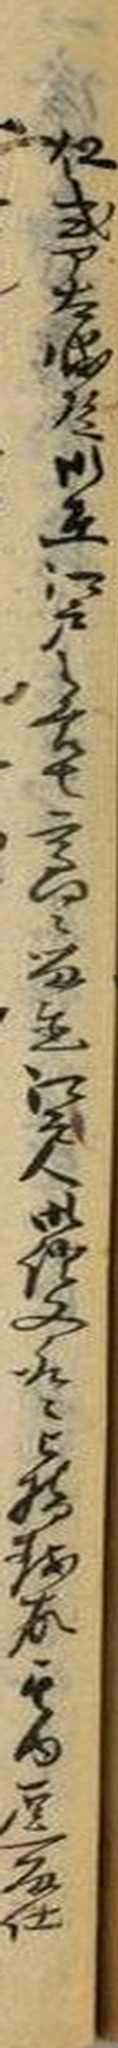但式部大輔殿御在江戸之節者高田ニ留置江戸へ御証文取ニ被指越故其内逗留仕よし
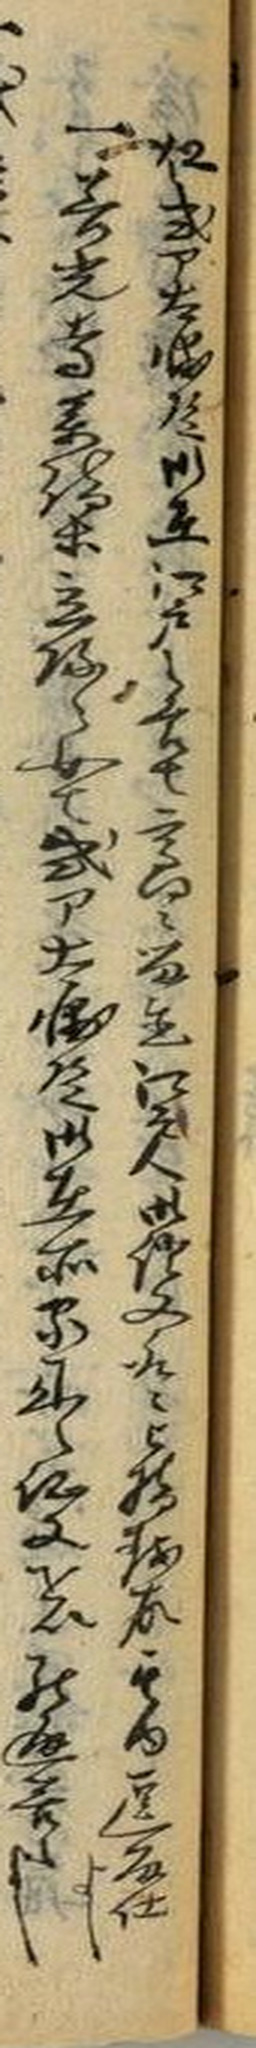一善光寺参詣等立帰候女者式部大輔殿御在所家来之証文を以罷通筈之よし
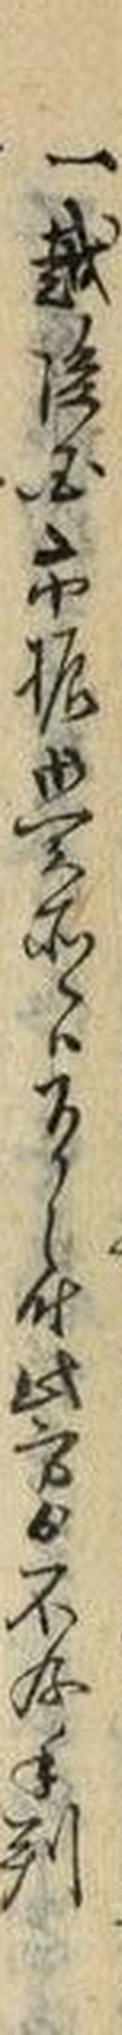一越後国市振御関所ヘハ下り之時此方ゟ不及手判
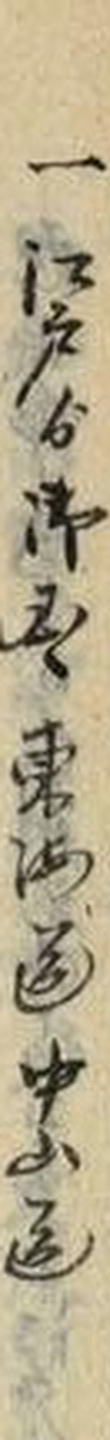一江戸ゟ御国へ東海道中山道
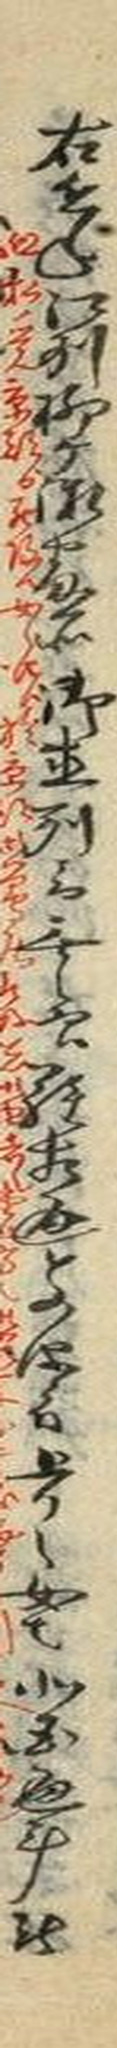右近年江州柳ケ瀬番所御直列ニ而無之而ハ難相通との儀ニ付上り之女者北国通斗被
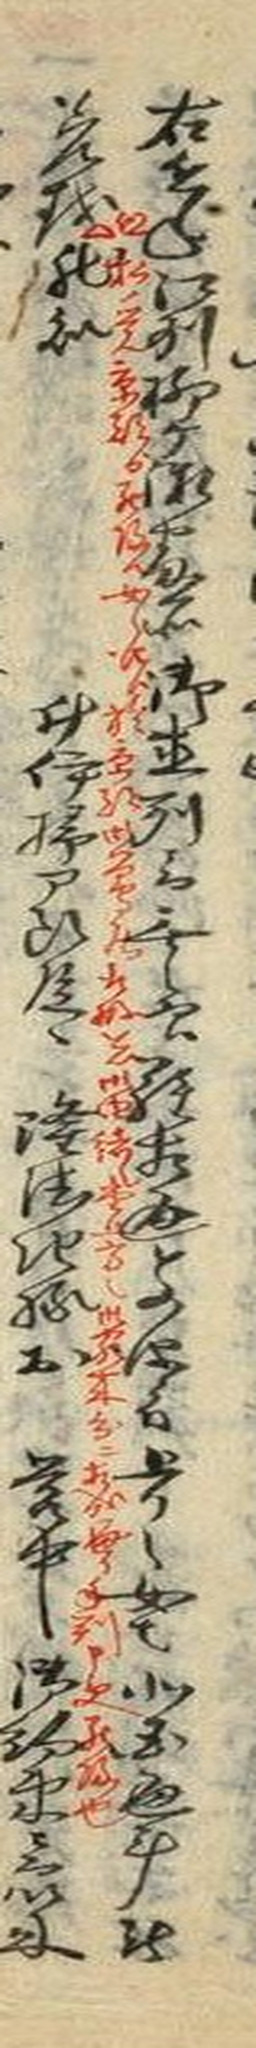井伊掃部頭殿へ隆法院様於営中御約束ニ而以来
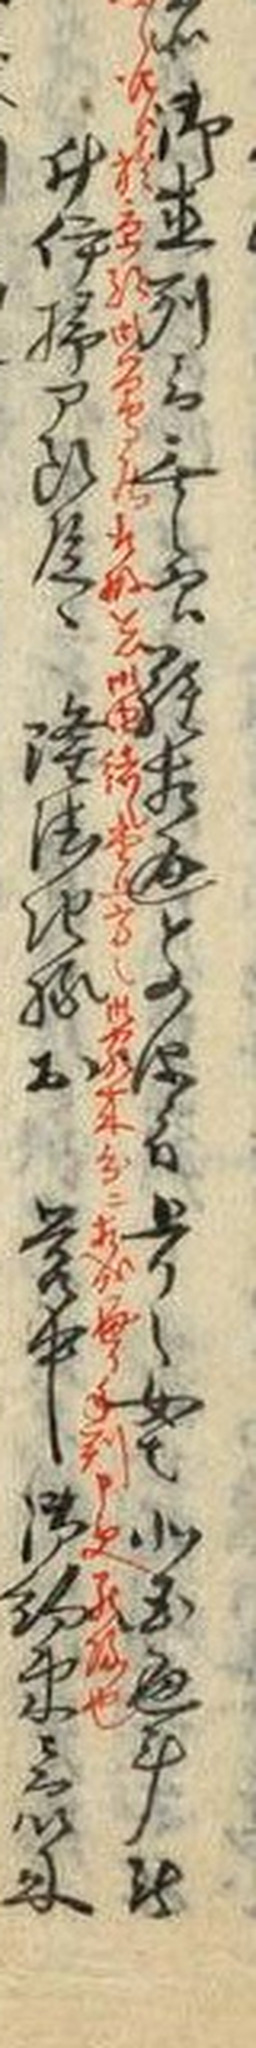井伊掃部頭殿へ隆法院様於営中御約束ニ而以来
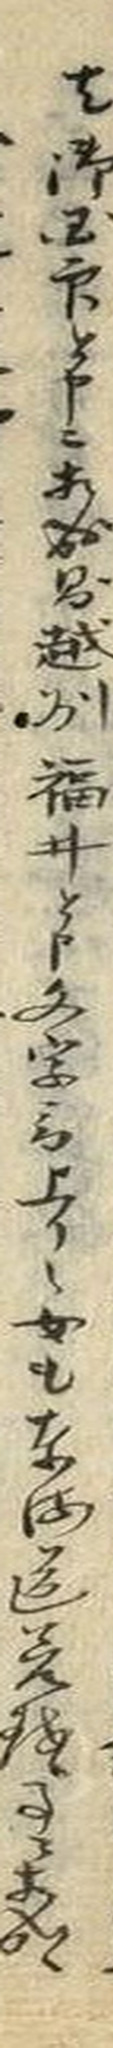者御国印と申ニ相成則越州福井と申文字ニ而上り之女も東海道差越候事ニ相成候
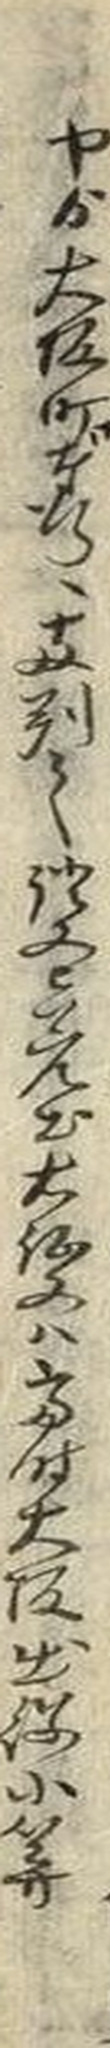中ゟ大坂町御奉行へ両判之証文被差出右例文ハ当時大坂出役小算
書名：御国他国諸事之部
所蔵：福井県文書館 Fukui Prefectural Archives
